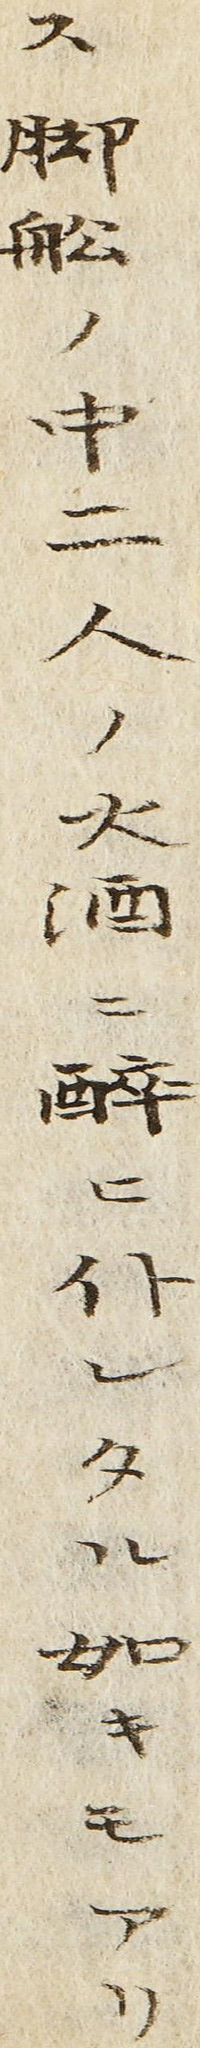ス脚船ノ中二人ノ火酒ニ酔ヒ仆レタル如キモアリ
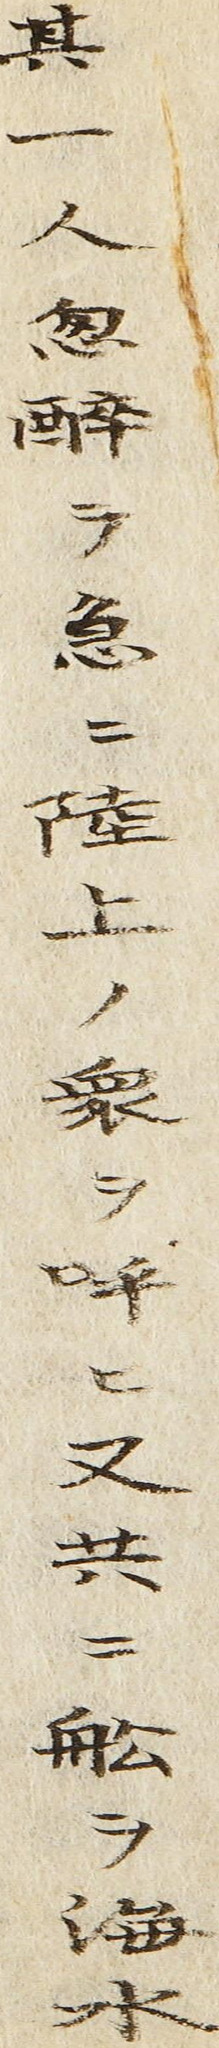其一人忽酔テ急ニ陸上ノ衆ヲ呼ヒ又共ニ船ヲ海水
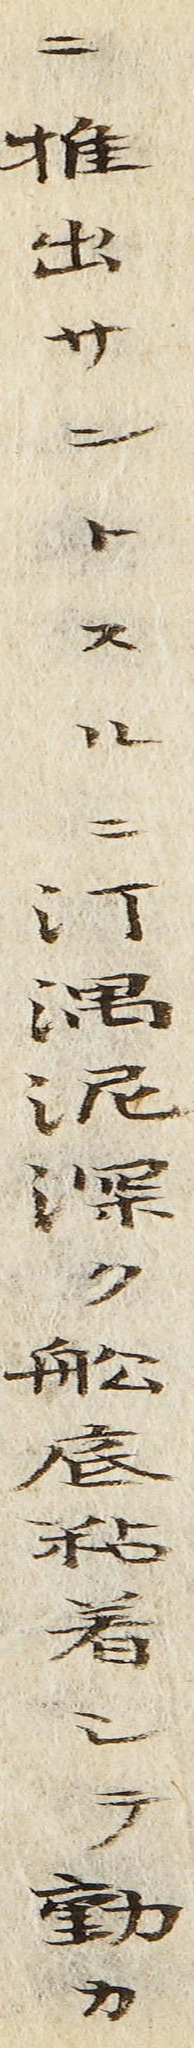ニ推出サントスルニ汀湡泥深ク船底粘着シテ動カ
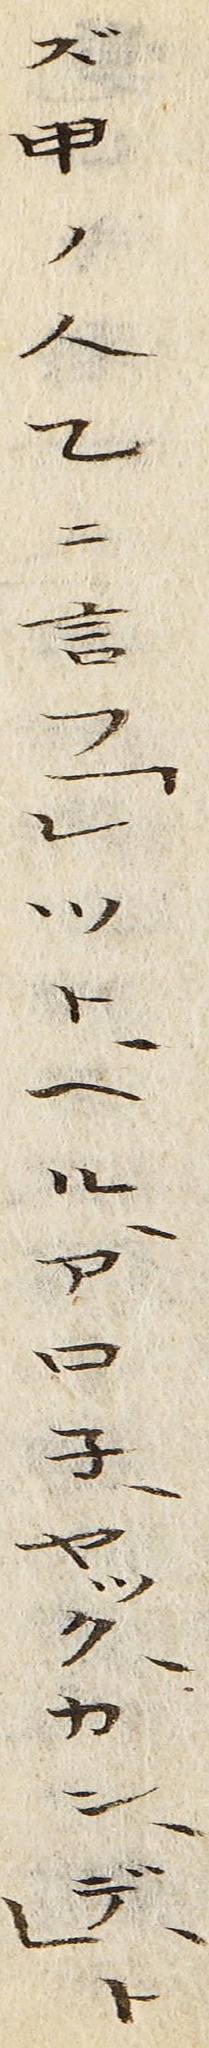ズ甲ノ人乙ニ言フ「レツト、ヘル、アロネ、ヤック、カン、デ、」ト
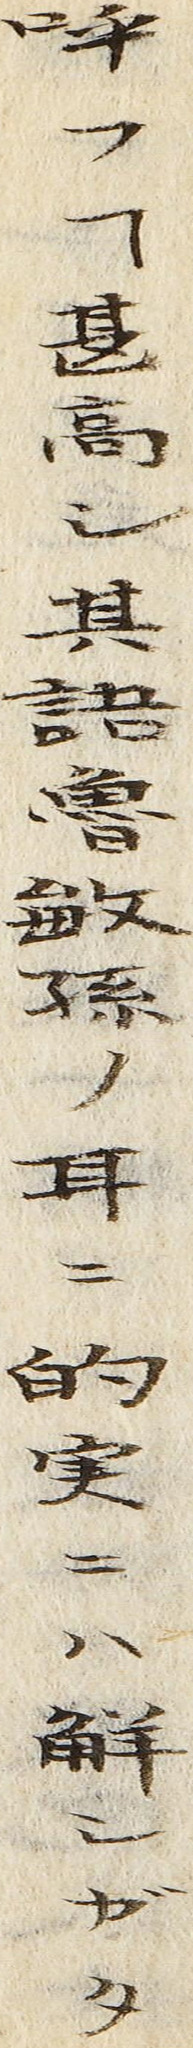呼フコト甚高シ其語魯敏孫ノ耳ニ的実ニハ解シガタ
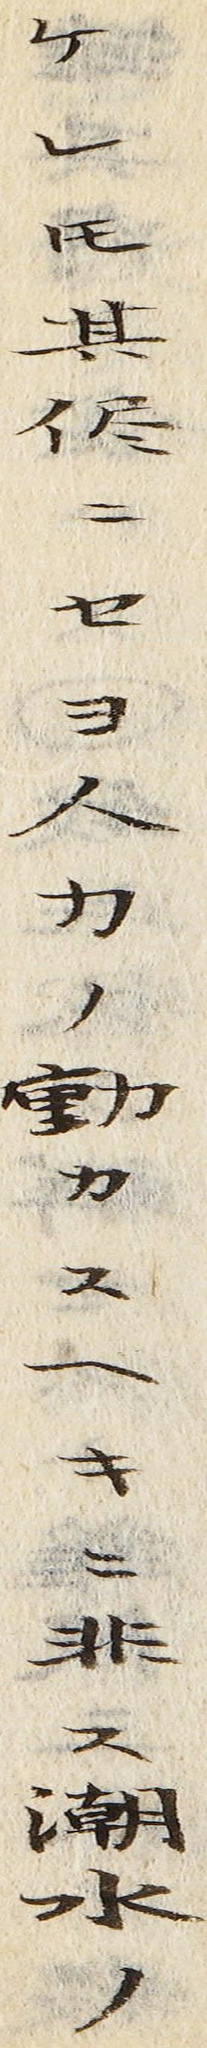ケレトモ其侭ニセヨ人力ノ動カスヘキニ非ス潮水ノ
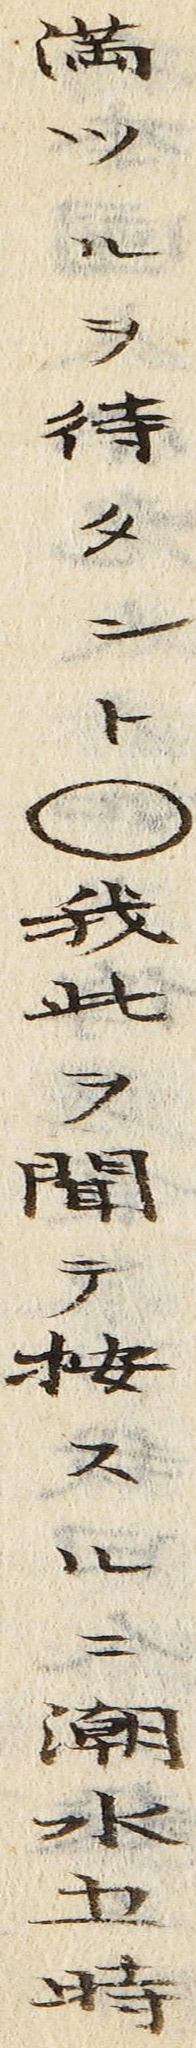満ツルヲ待タント◯我此ヲ聞テ按スルニ潮水五時
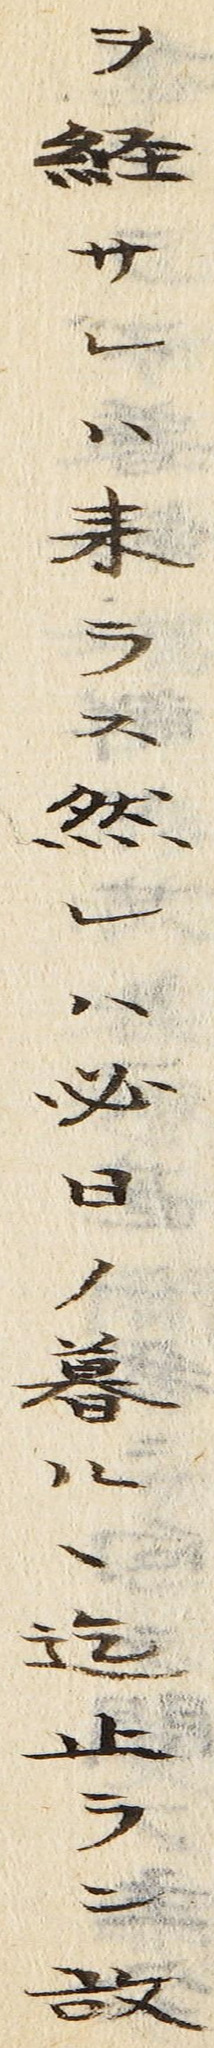ヲ経サレハ来ラス然レハ必日ノ暮ルヽ迄止ラン故
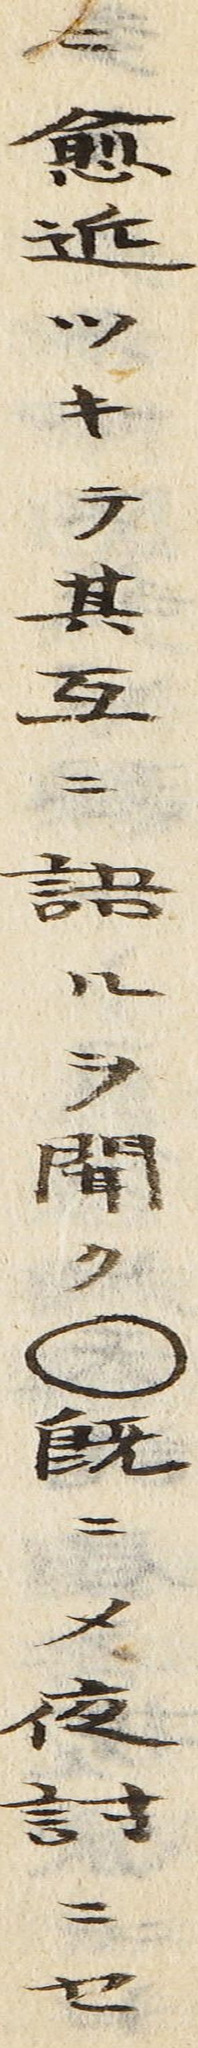ニ愈近ツキテ其互ニ語ルヲ聞ク◯既ニシテ夜討ニセ
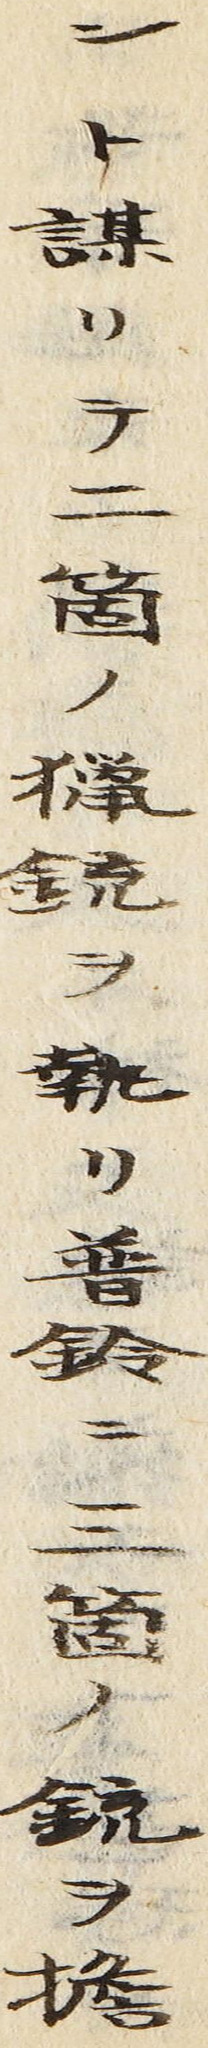ント謀リテ二箇ノ猟銃ヲ執リ普鈴ニ三箇ノ銃ヲ担
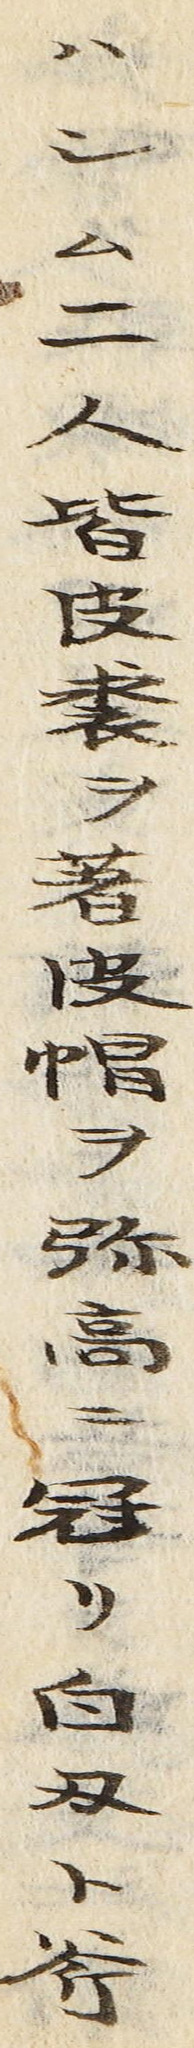ハシム二人皆皮裘ヲ著皮帽ヲ弥高ニ冠リ白刃ト斧
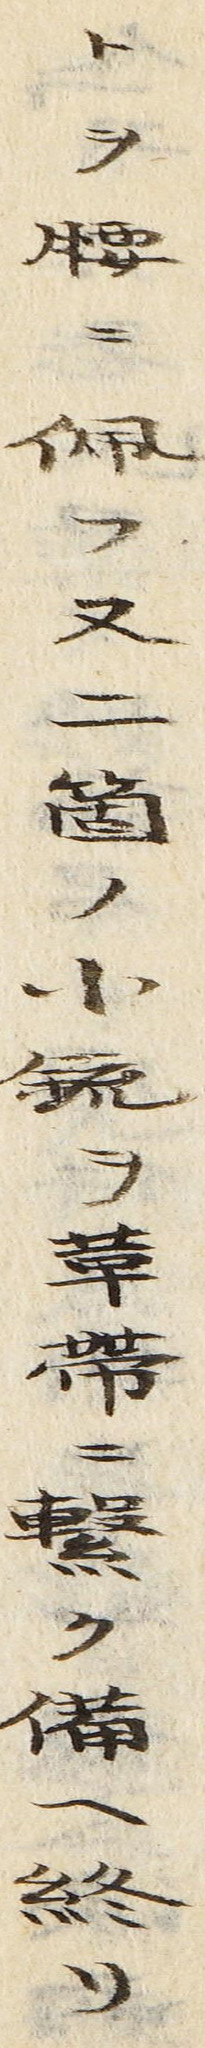トヲ腰ニ佩フ又二箇ノ小銃ヲ革帯ニ繋ク備ヘ終リ
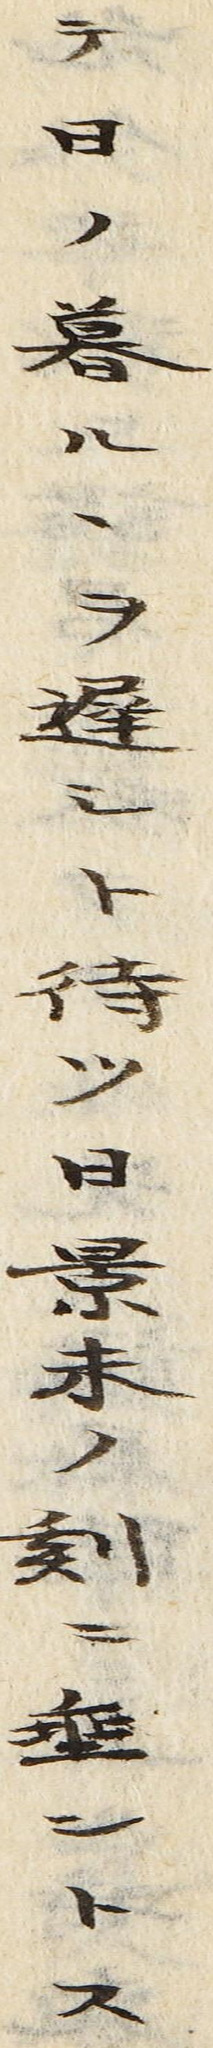テ日ノ暮ルヽヲ遅シト待ツ日景未ノ刻ニ垂ントス
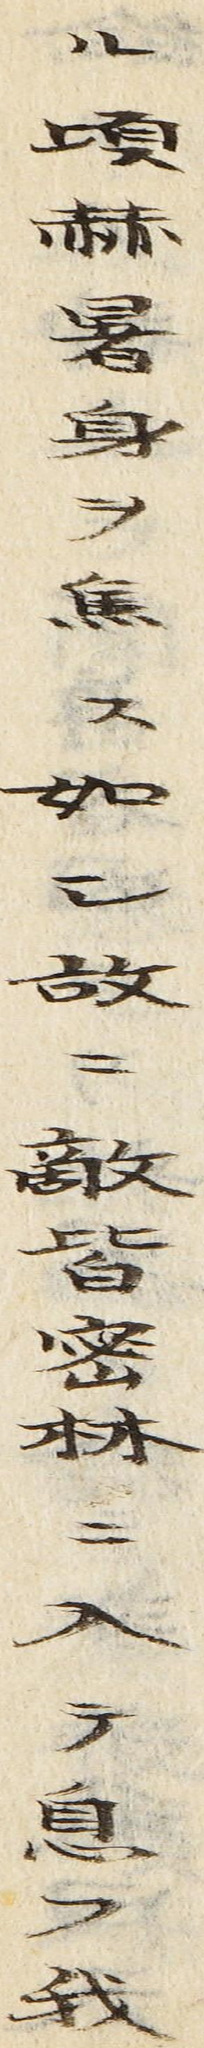ル頃赫暑身ヲ焦ス如シ故ニ敵皆密林ニ入テ息フ我
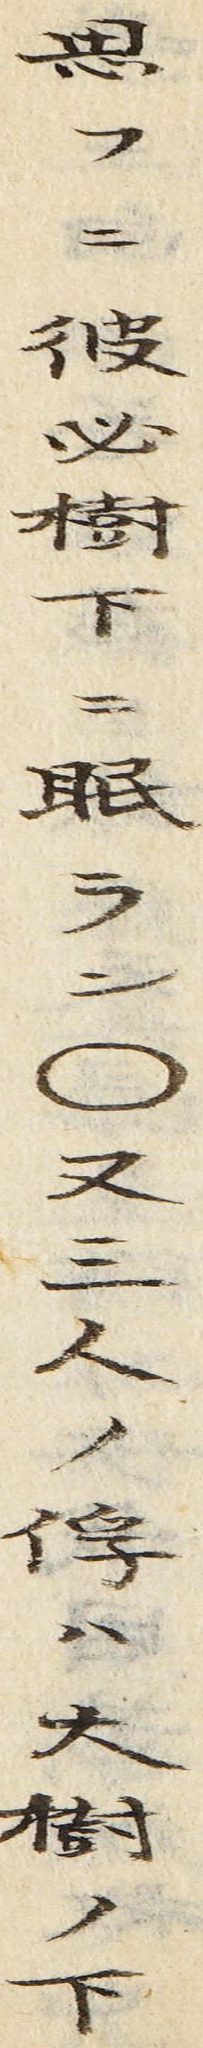思フニ彼必樹下ニ眠ラン◯又三人ノ俘ハ大樹ノ下
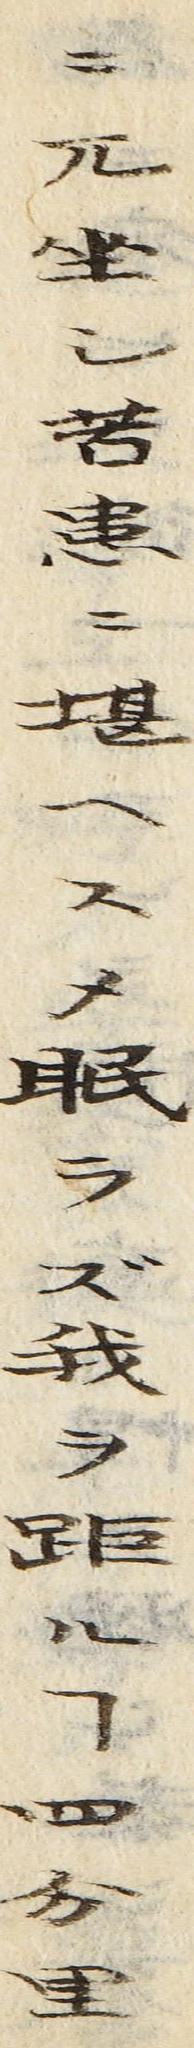ニ兀坐シ苦患ニ堪ヘスシテ眠ラズ我ヲ距ルコト四分里
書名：漂流紀事
